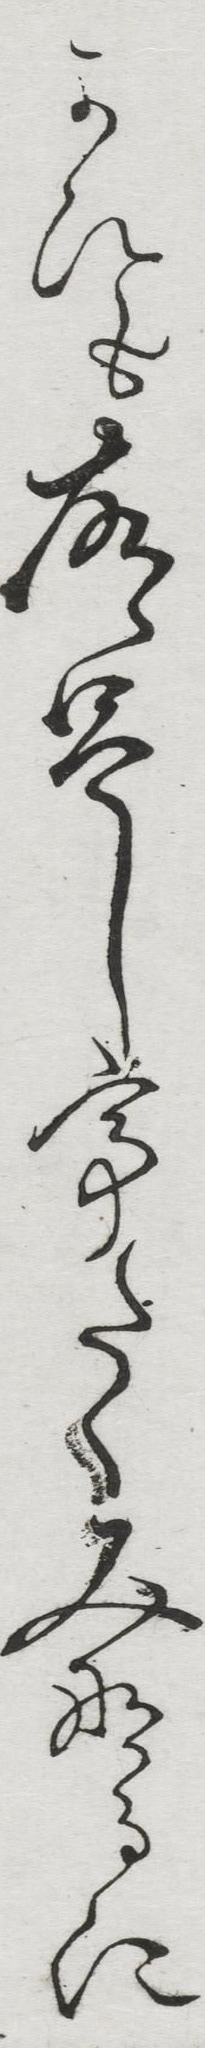かひもこゝろしてたくみなるに
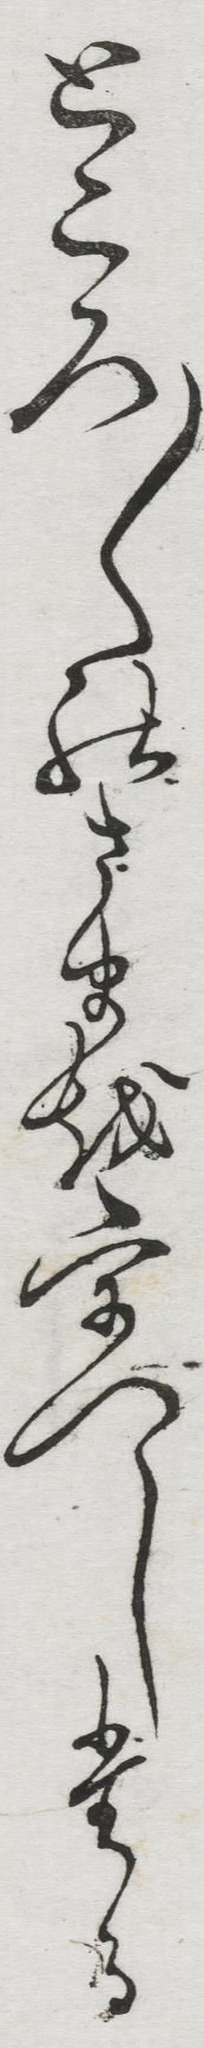ところ〳〵のさまをうつしたる
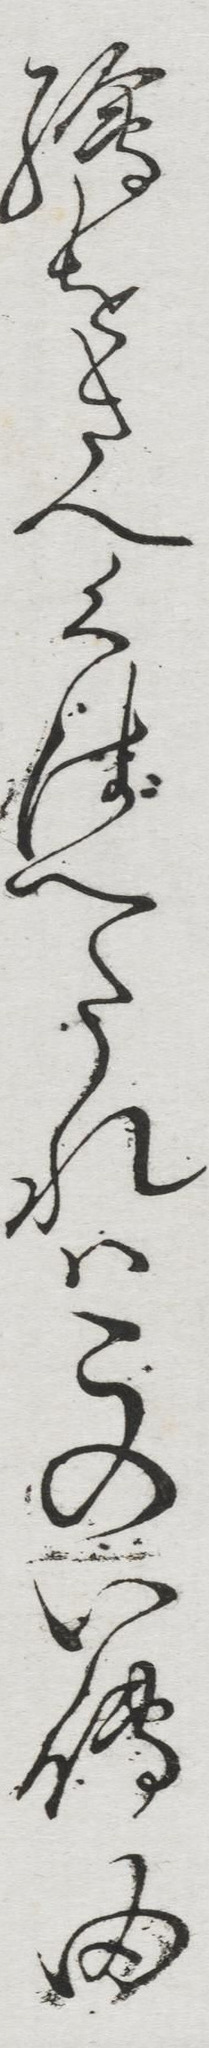絵をさへくはへたれはこのいてゆ
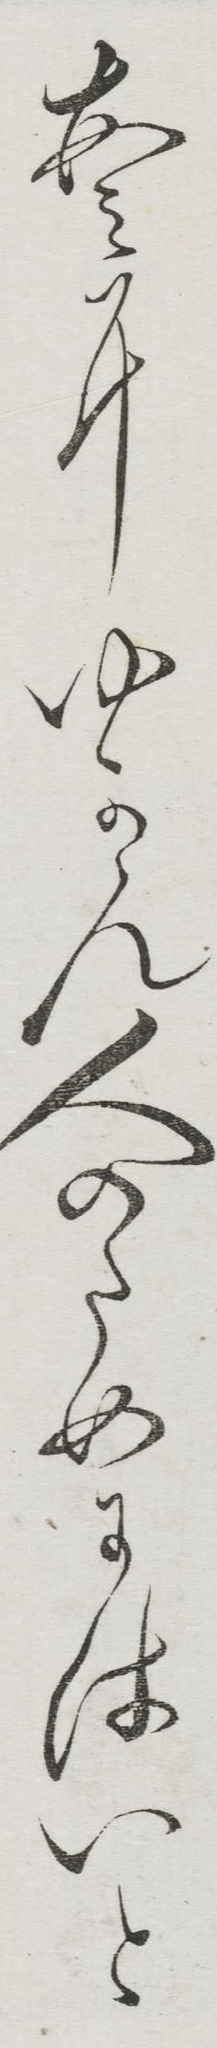あみにゆかん人のためにはいと
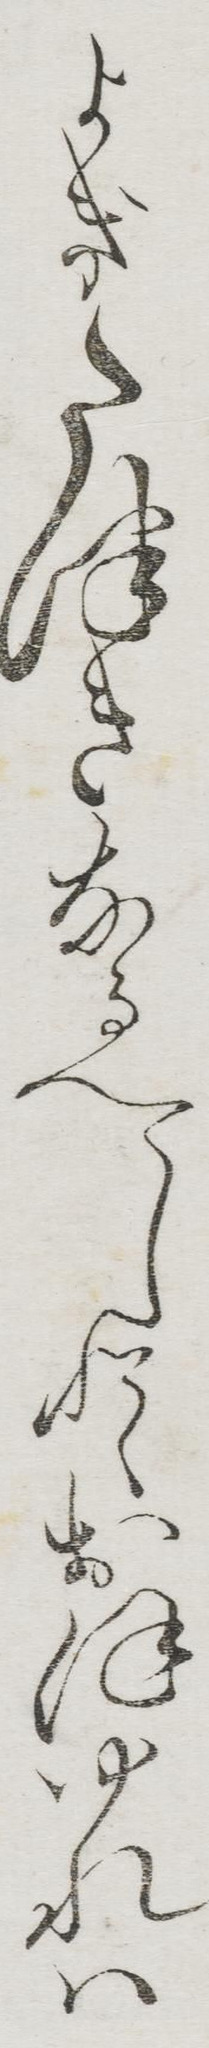よきたつきなるへしとおほゆれは
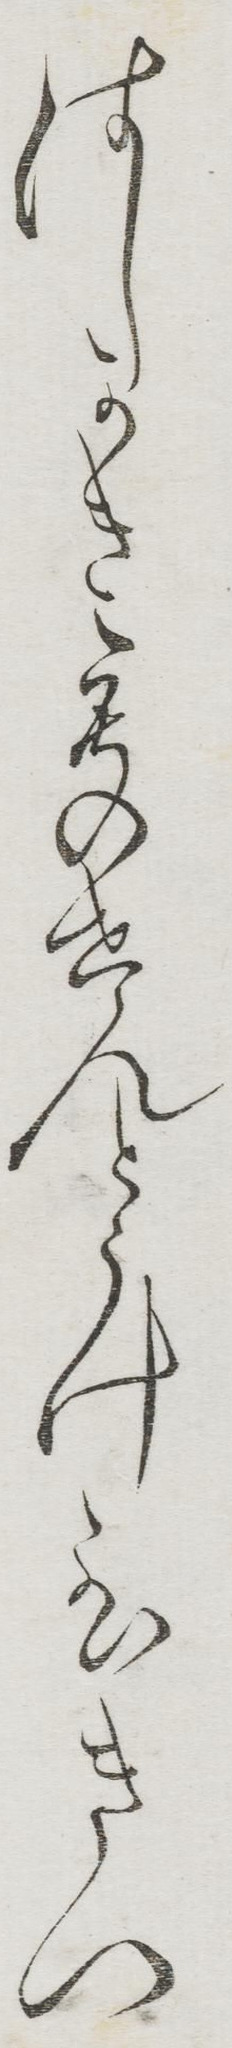はしかきものせんとうけひきつ
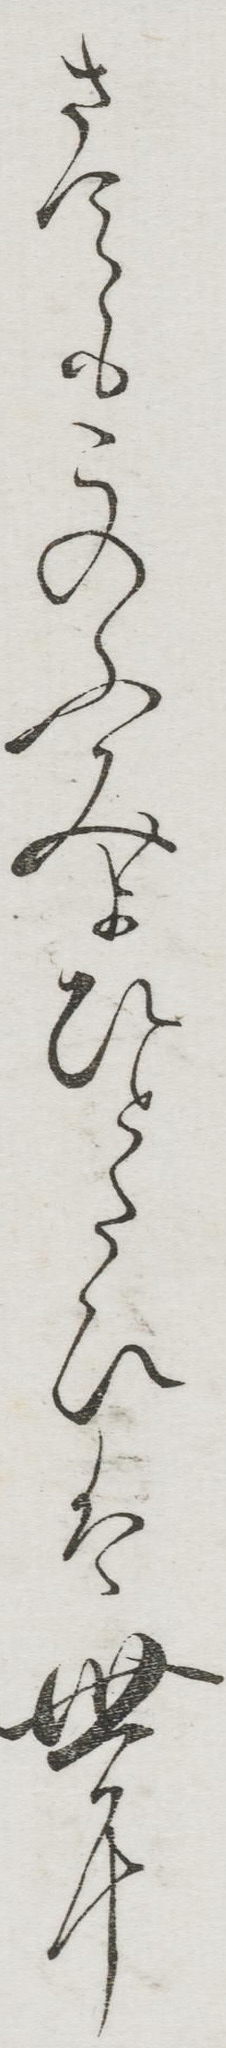さてもこのふみよひとたひは世に
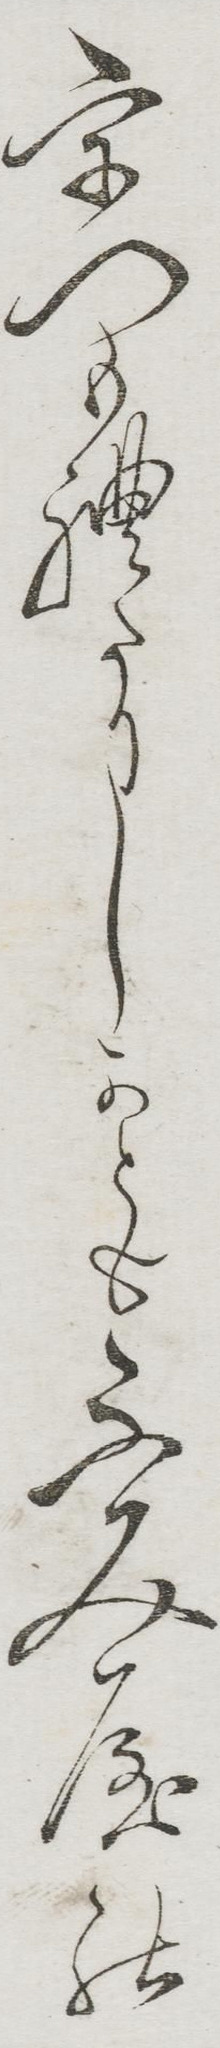うつもれたりしかともふみやの
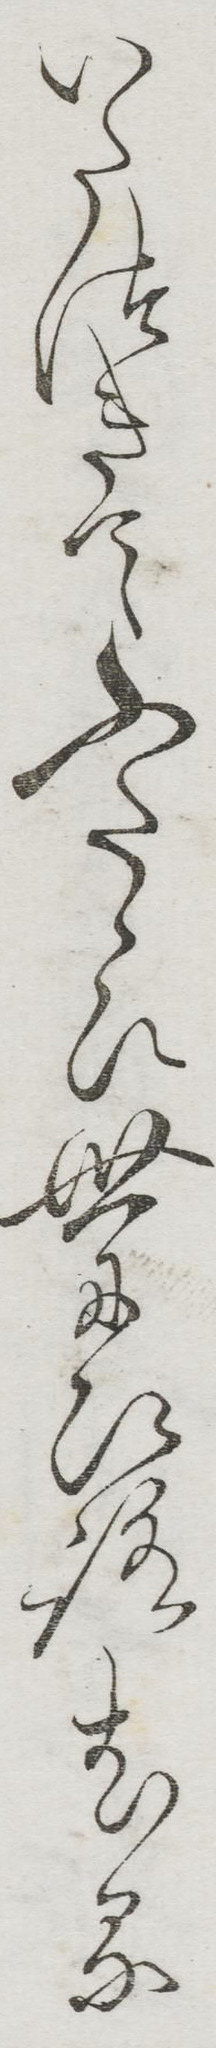いたつきてふたゝひ世にひろむる
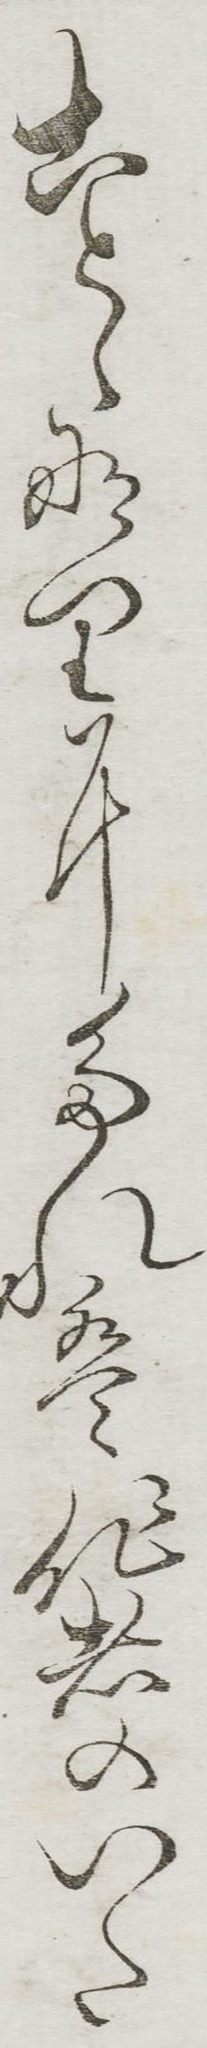ことゝなりにたれは作者のいた
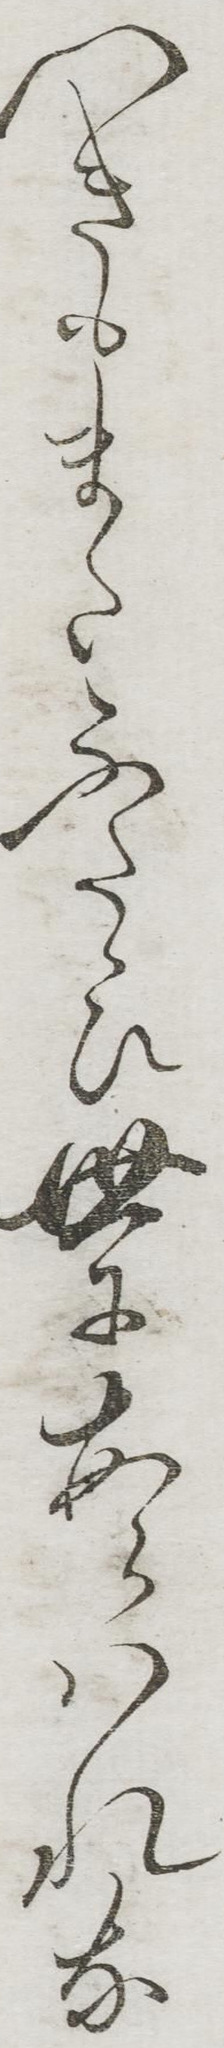つきもまたふたゝひ世にあらはれな

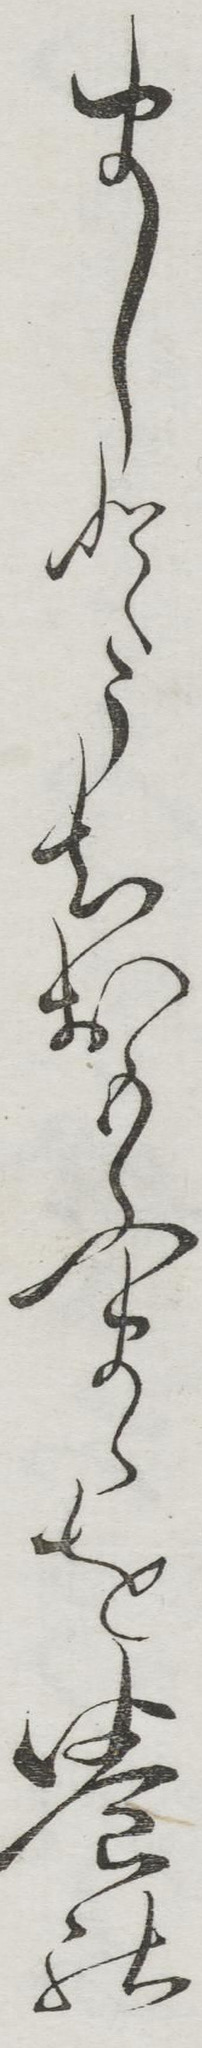ましとうちおもふまゝを巻の
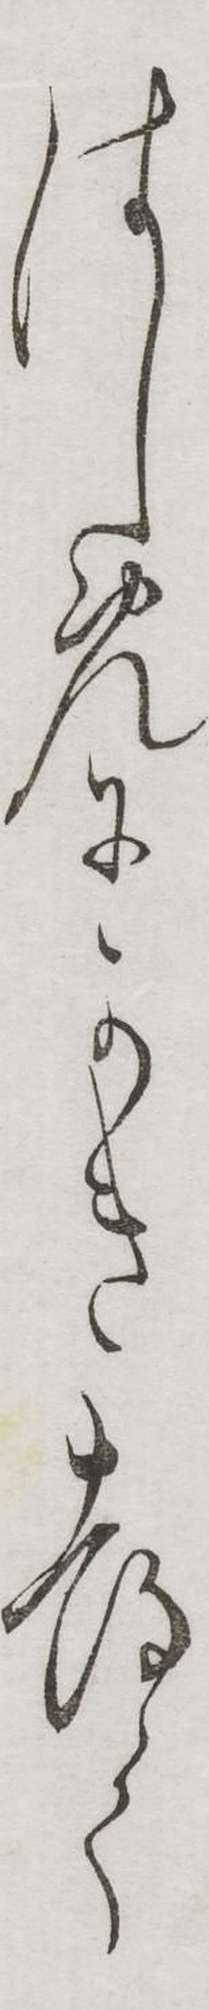はしめにかきつく
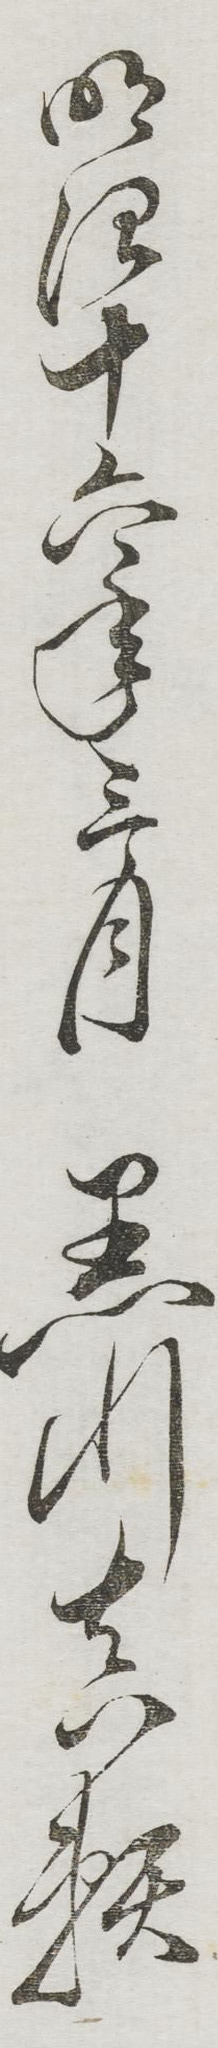明治十六年三月黒川真頼
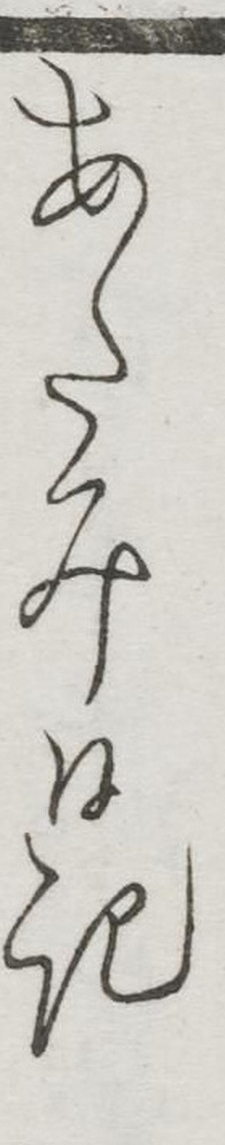あたみ日記
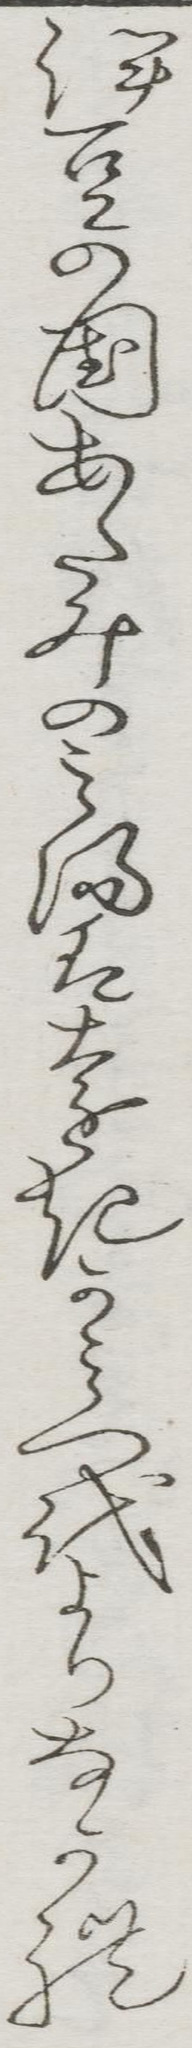伊豆の国あたみのみ湯はたときかみつ代よりなかれ
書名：挿画熱海日記　全
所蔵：東京大学地震研究所図書室 Earthquake Research Institute Library, The University of Tokyo, JAPAN
